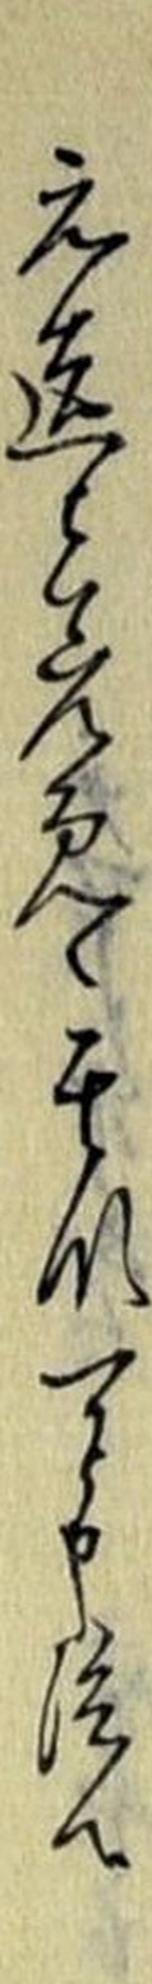元造被差免候其段可被申渡候
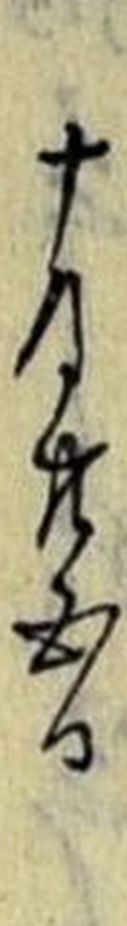十月廿五日
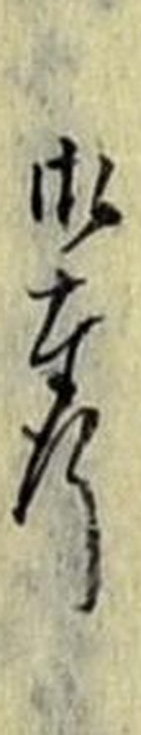御奉行
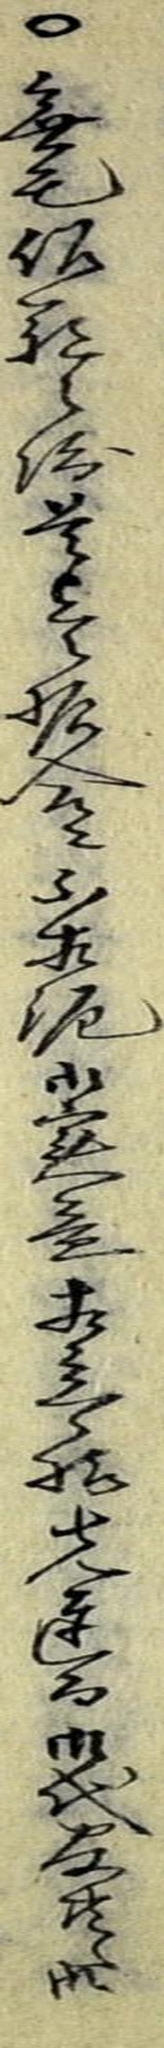○無毛作難之儀是迄之振合に不相泥御実益相立候様先達而御代官共へ御
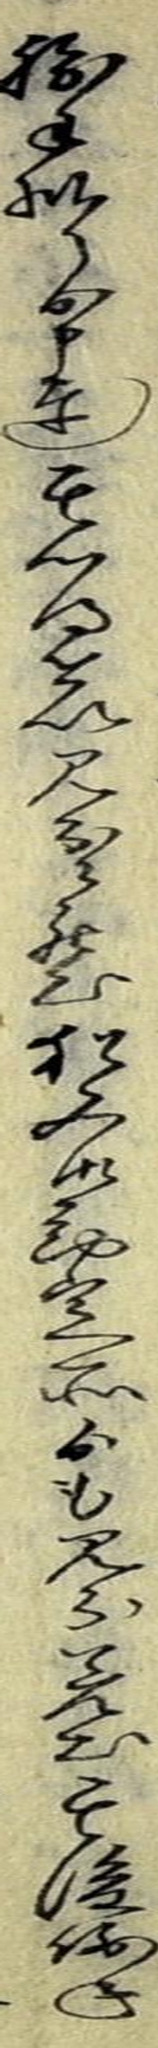勝手掛りゟ申達其心得を以見分に罷出猶又御勘定所ゟも見分差出其後例年
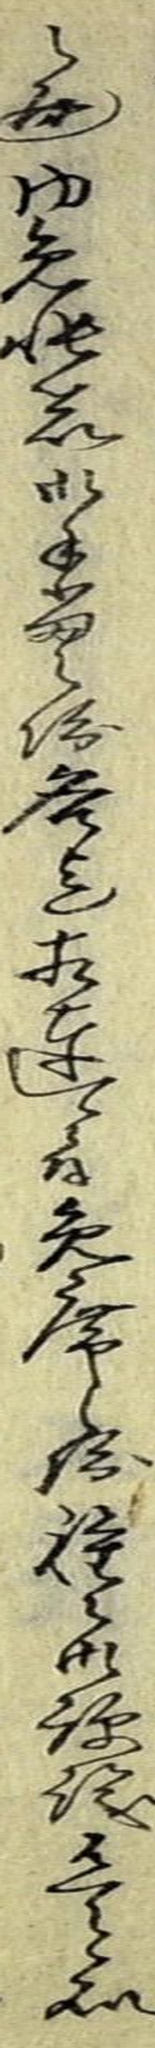之通内免帳を以御手当之儀各迄相達候に付免席之儀種々御評議有之候処
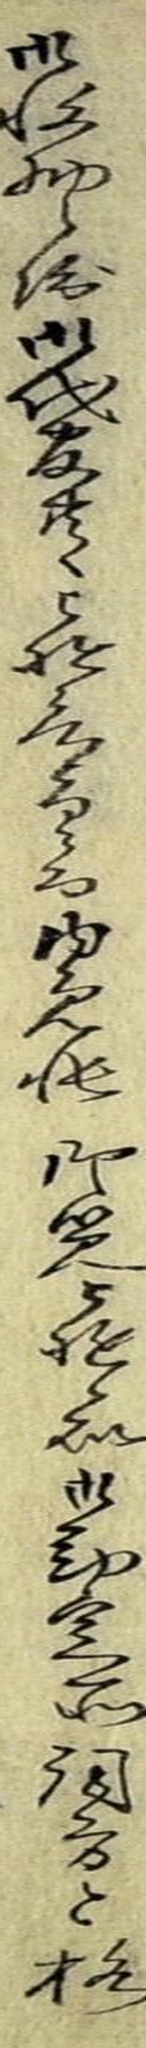御収納之儀御代官共へ被遊度旨に而内免帳御覧被遊候処御勘定所調方と格
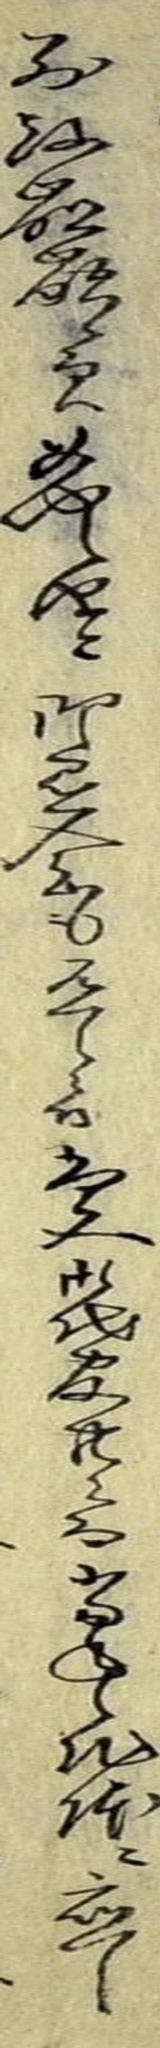別致齟齬候而は如何之儀に御懸念も有之候に付尚又御代官共に而当年之作体に応し
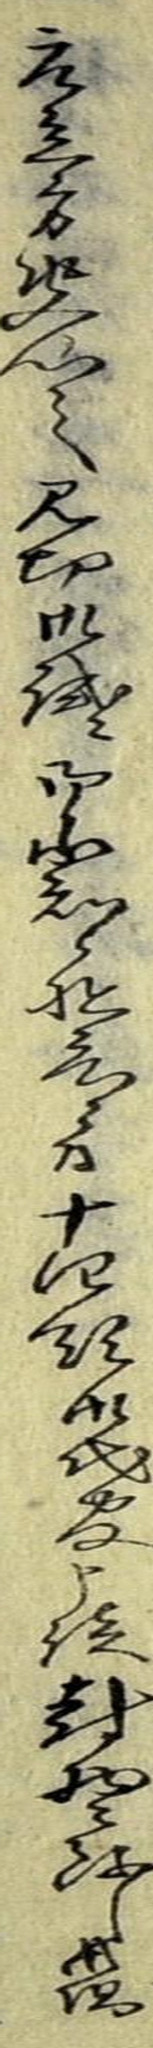取立方決心之見切御試に御承知被遊度に付十四領御代官申談封物に致し御側
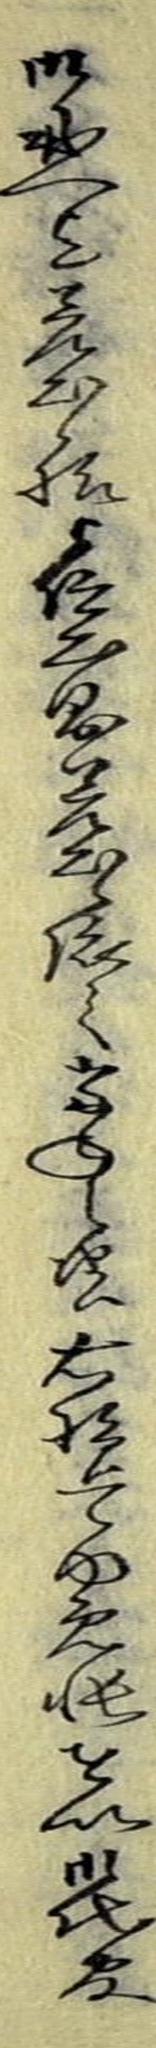御用人迄差出候様被仰出即差出候依之当年之儀は右指上候内免帳を以御代官

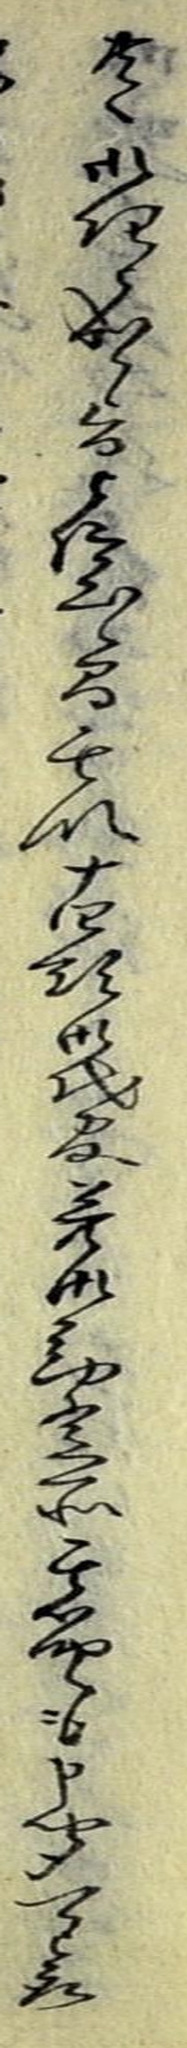共へ御任被成候旨被仰出候間其段十四領御代官并御勘定所其筋へも申聞可被取
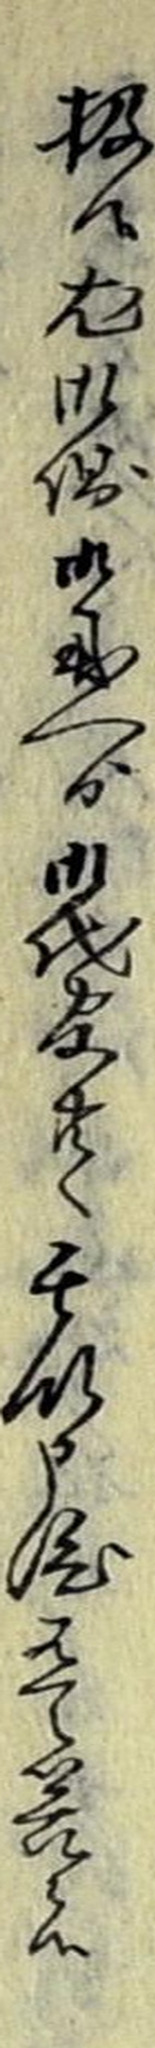扱候尤御側御用人ゟ御代官共へ其段申渡有之筈に候
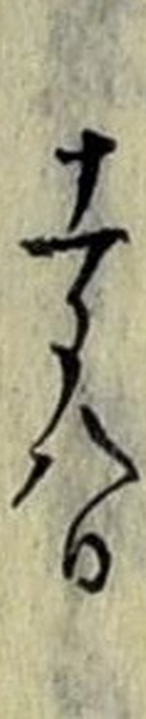十一月八日
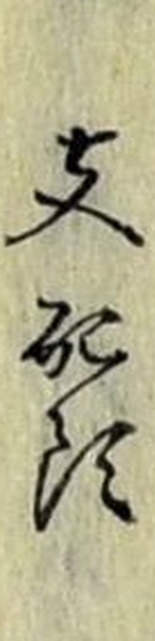支配頭
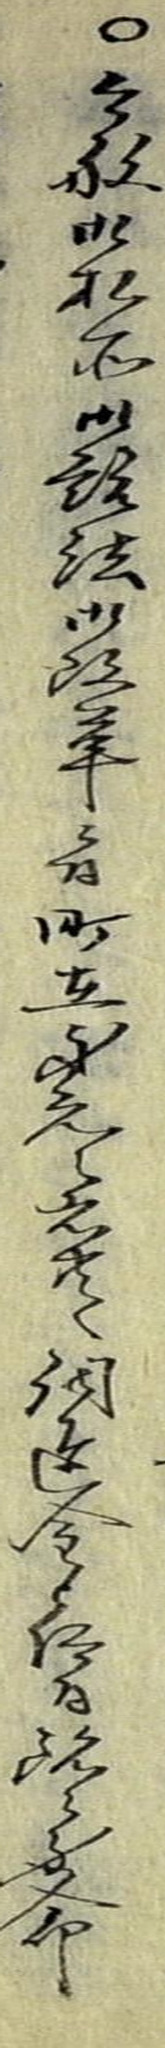○今般御札所御趣法御改革に付町在身元之者共へ調達金被仰付銘々身命
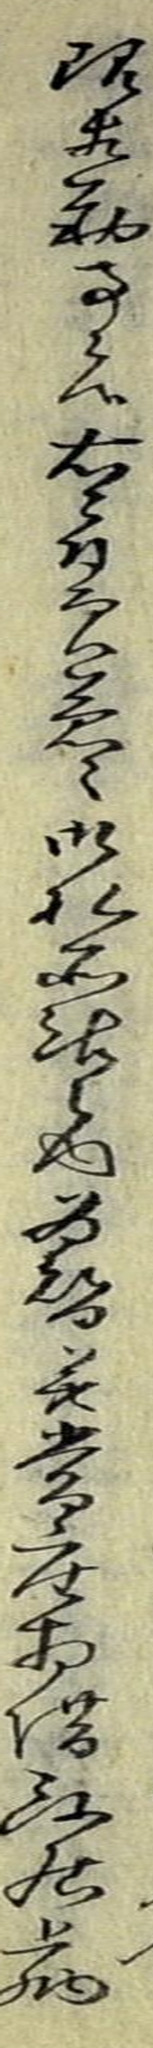限相勤事に候右に付而は兼々御札所銀之内為替并当座拝借致居上納
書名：命令之部 六
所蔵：福井県文書館 Fukui Prefectural Archives
